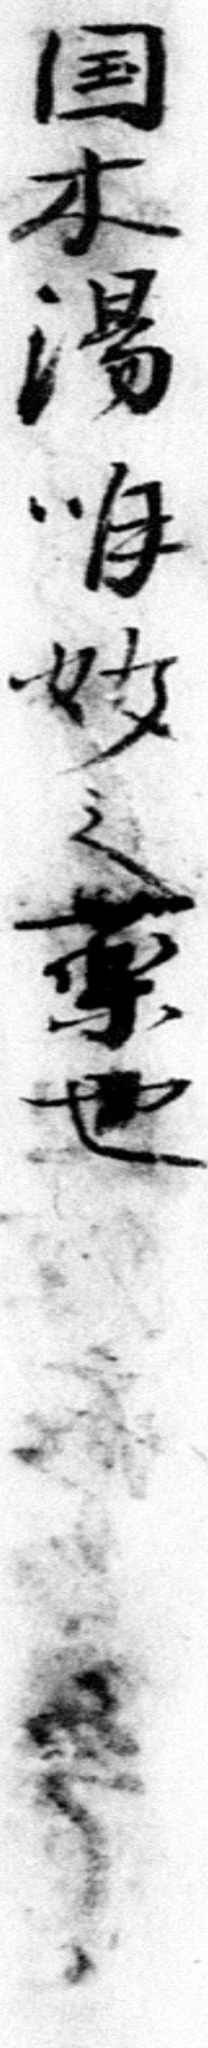国木湯明妙之薬也
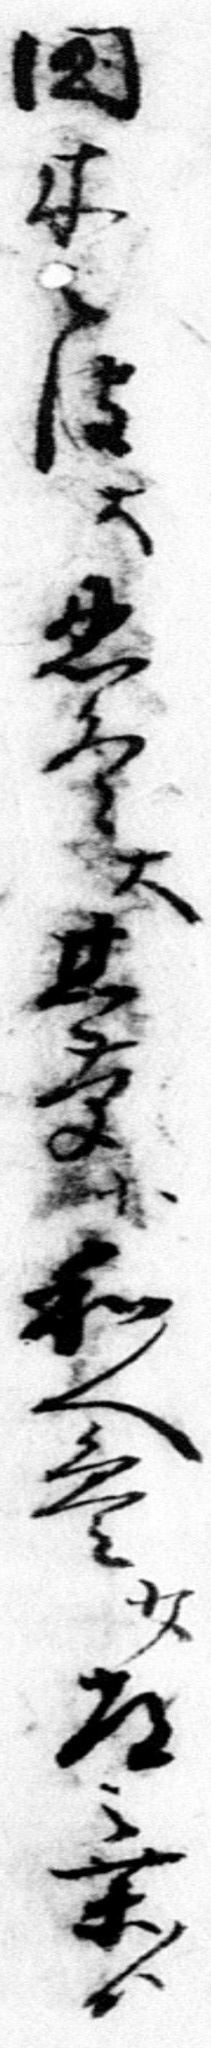国木之皮大忍冬大甘草小和人参小常の薬ゟ

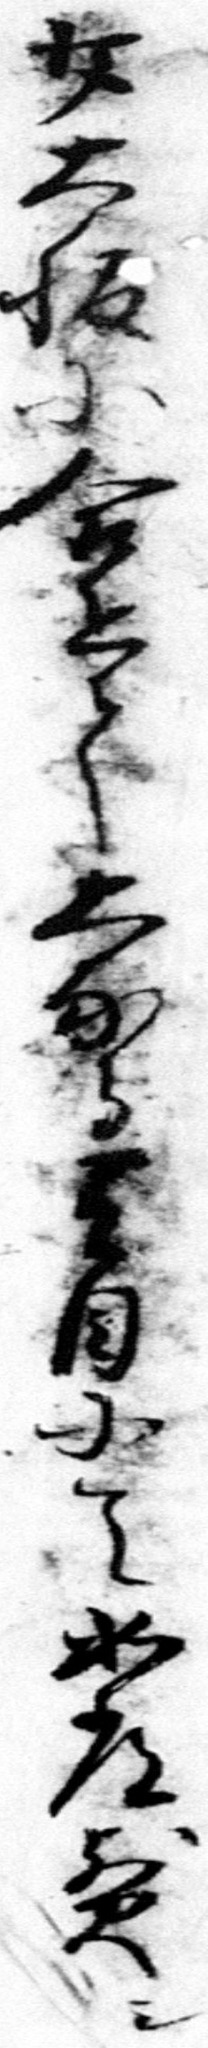少右様に合せて大なる天目にて如常煎し
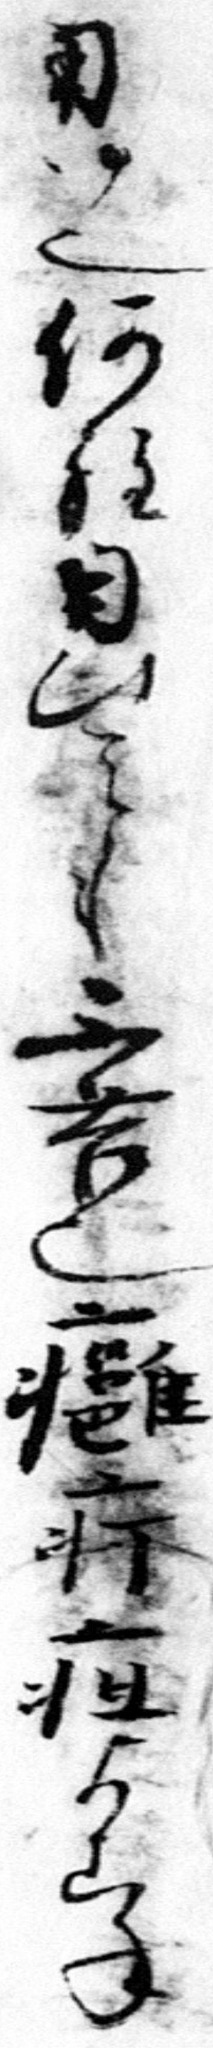用ゆ也何程用ひても不苦也癰疔疽よこね
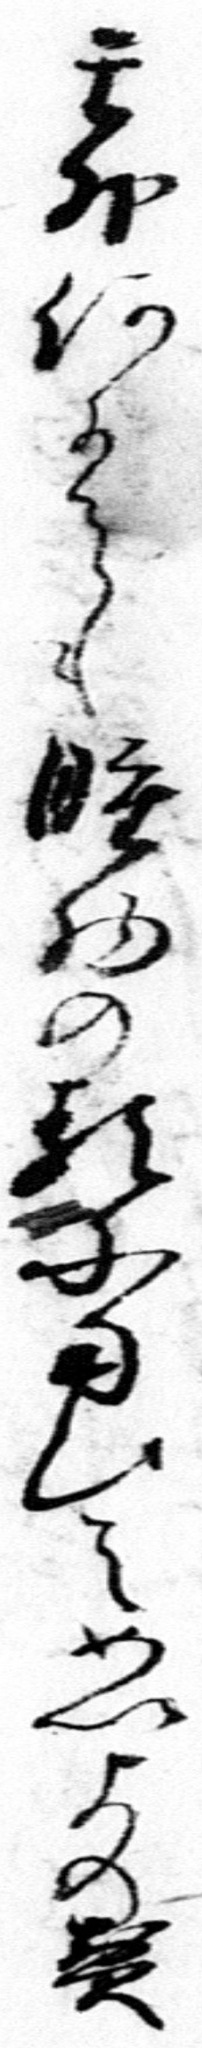其外何にても腫物の類に用ひてめいよの煎
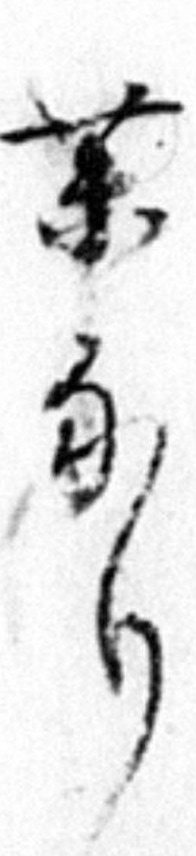薬なり
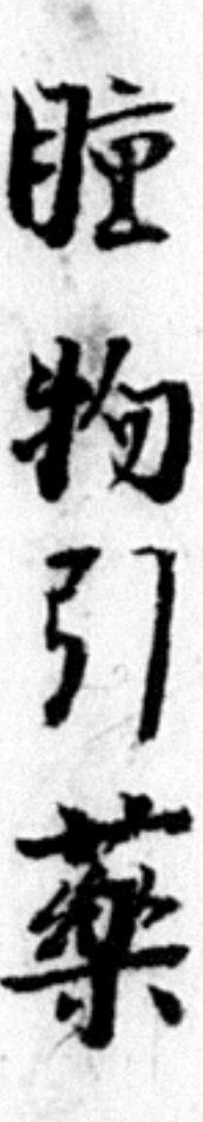腫物引薬
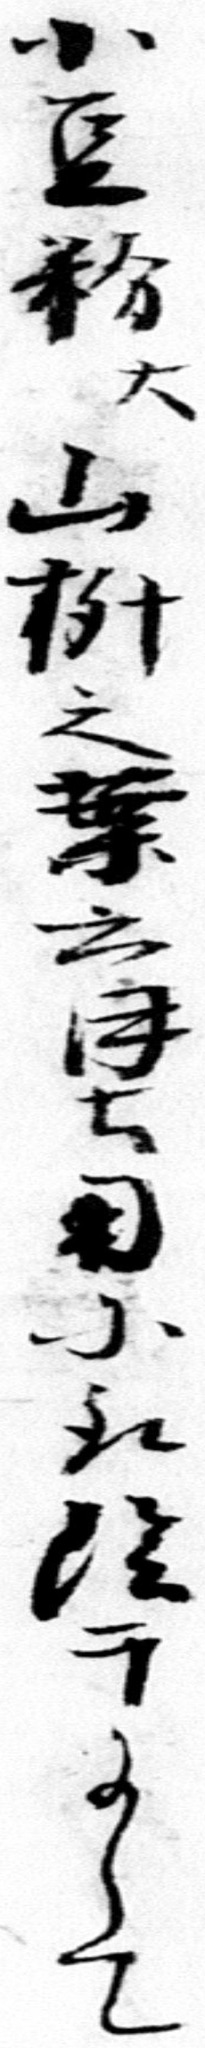小豆粉大山椒の葉六月土用に取陰干にして
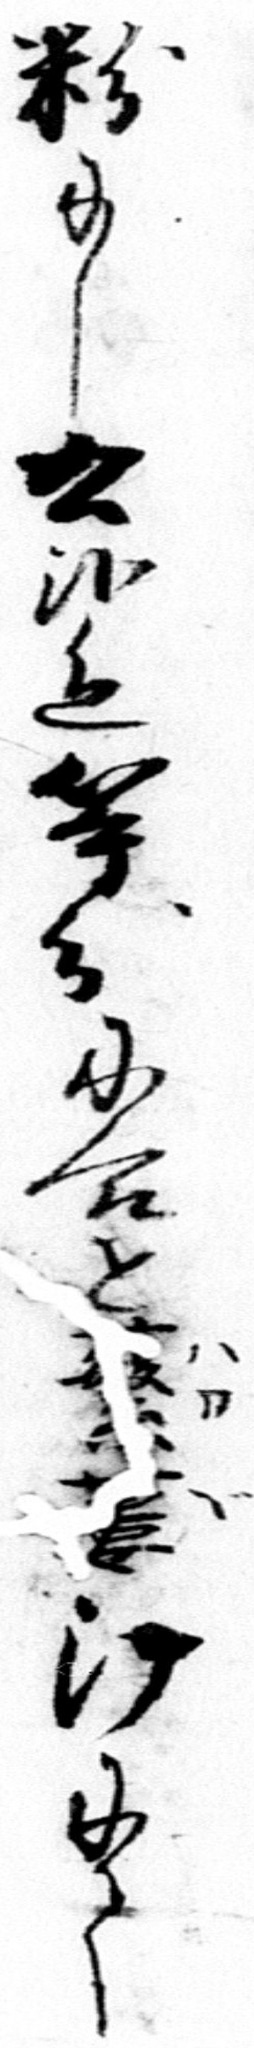粉にし右弐色等分に合せ蘩蔞汁にて
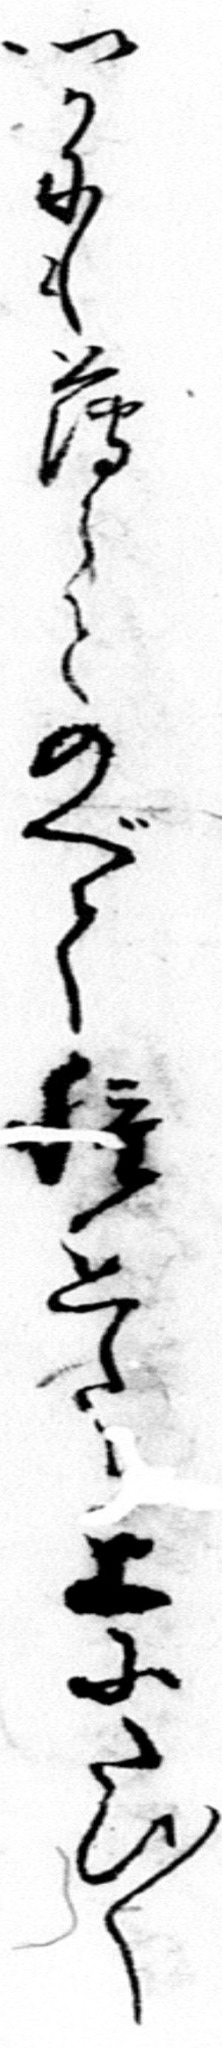いかにも薄してのべて腫れた上にたひ〳〵
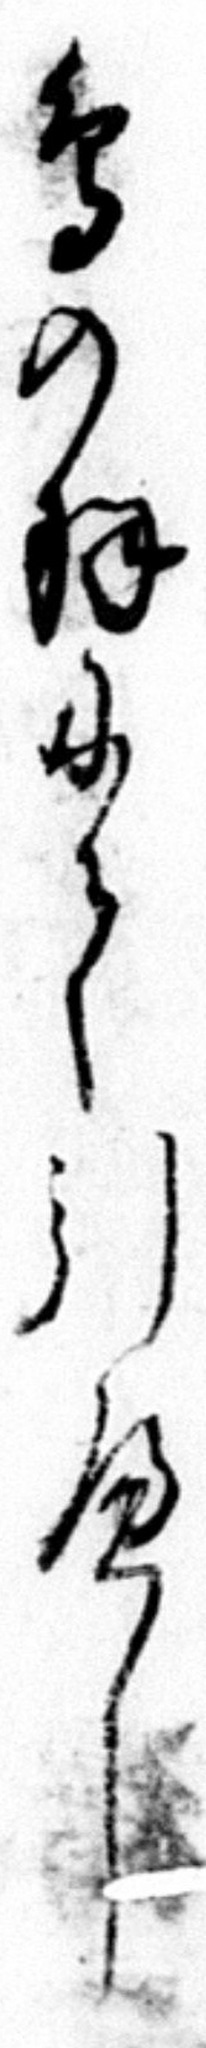鳥の羽にて引へし
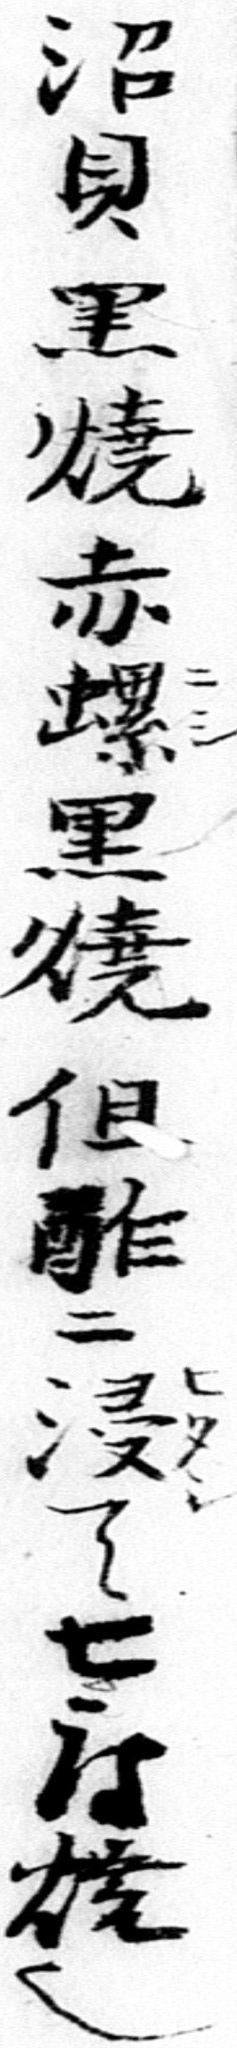沼貝黒焼赤螺黒焼但酢に浸て七度焼也
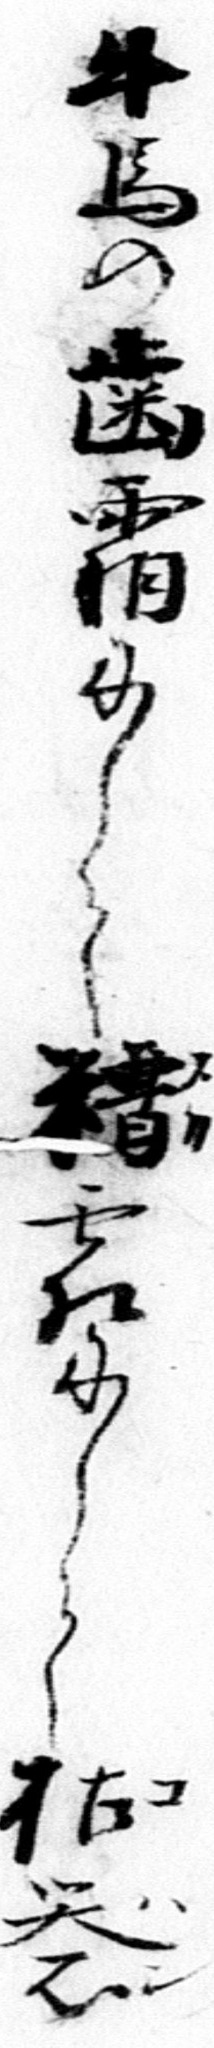牛馬の歯霜にして糠霜にして枯礬
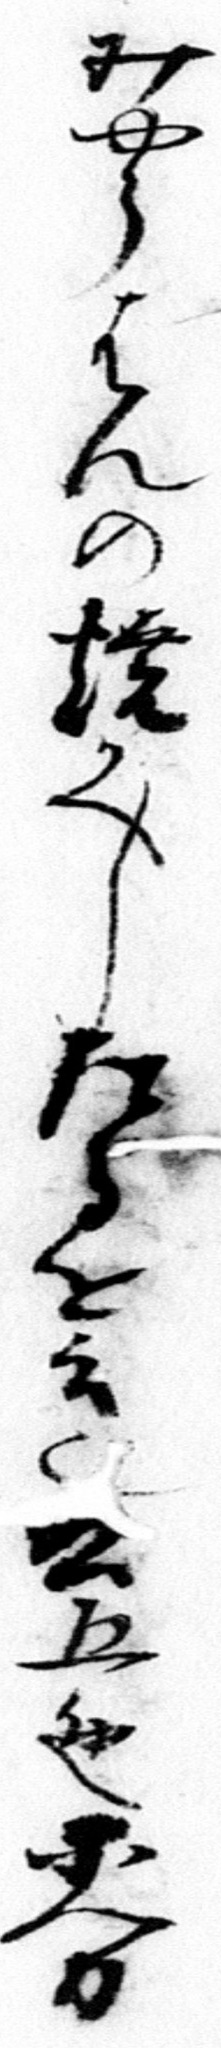みやうはんの焼かへしたるを云也右五色等分
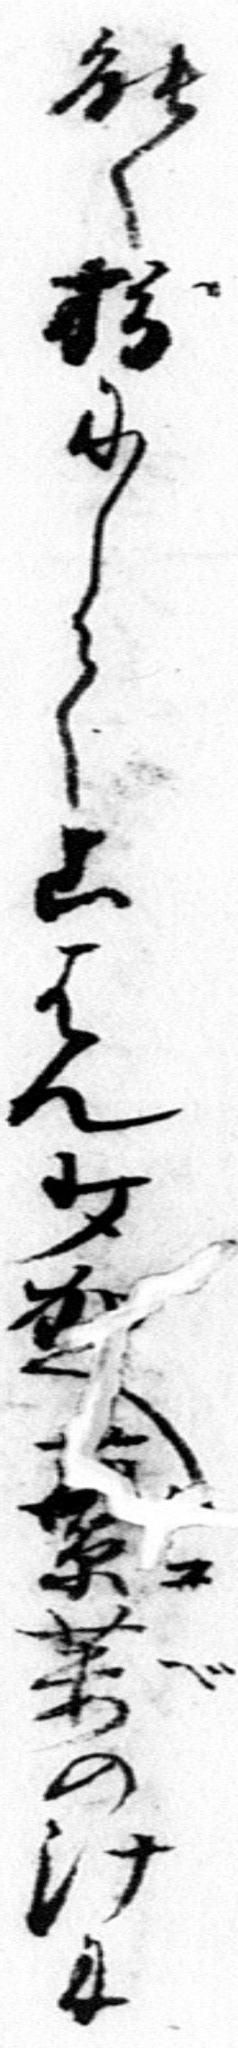能く粉にしてこはん少加へ蘩蔞の汁に
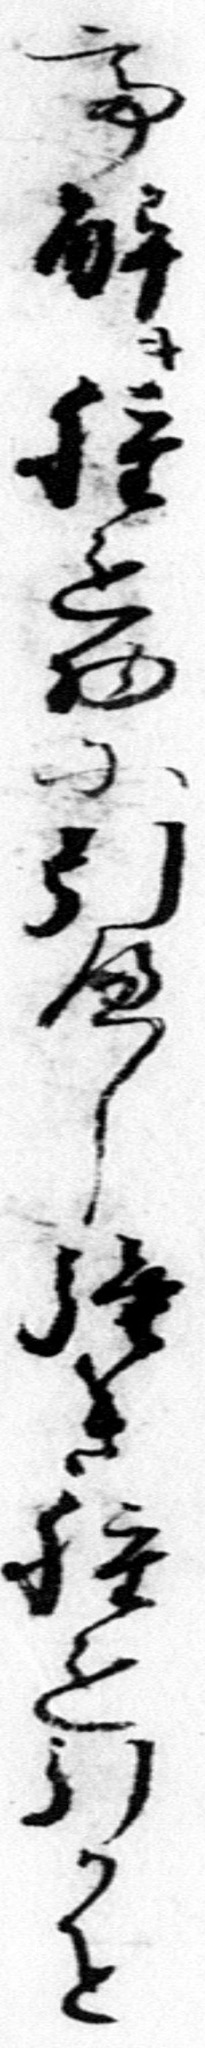て解き腫れ物に引へし強き腫れ引かせ
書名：名薬秘伝之書
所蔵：徳島県立図書館
